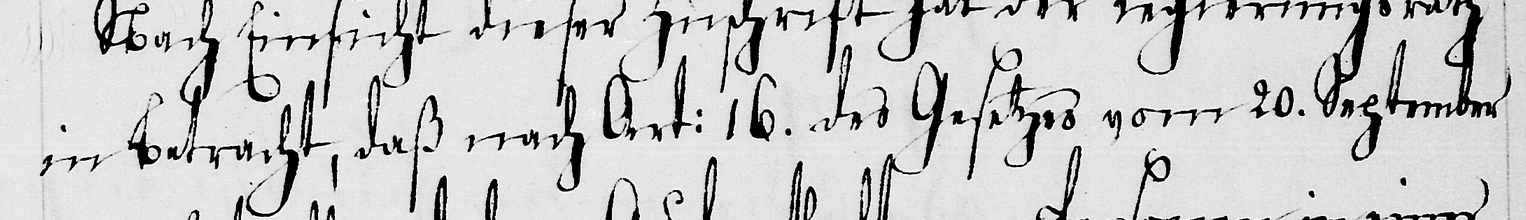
in Betracht, daß nach Art: 16. des Gesetzes vom 20. September
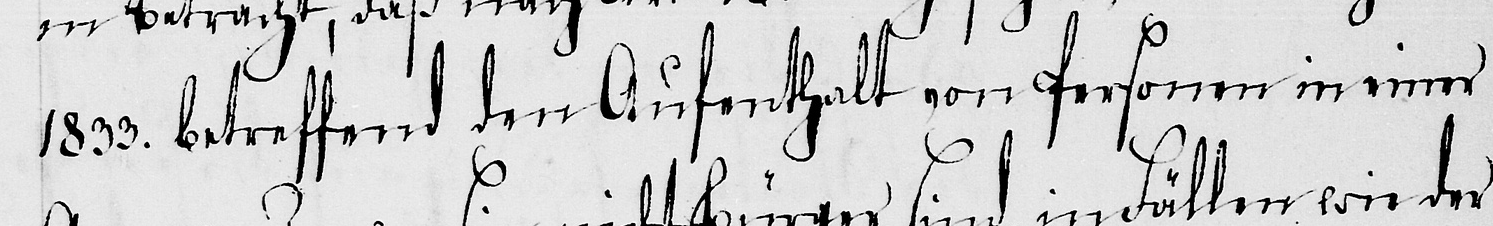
1833. betreffend den Aufenthalt von Personen in einer
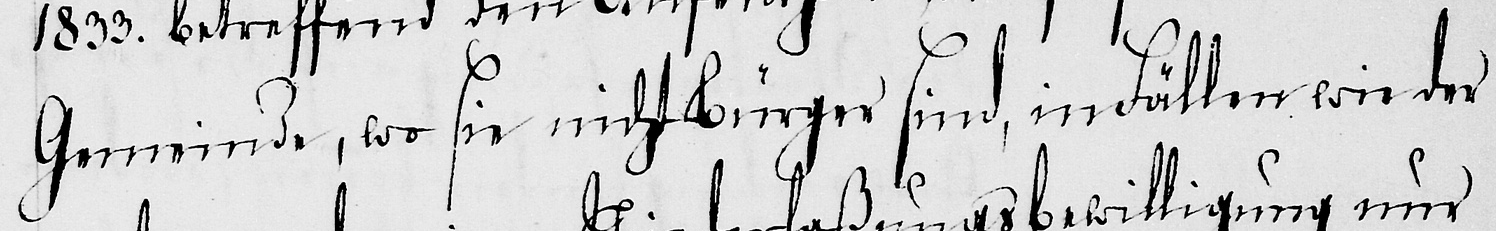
Gemeinde, wo sie nicht Bürger sind, in Fällen wie der
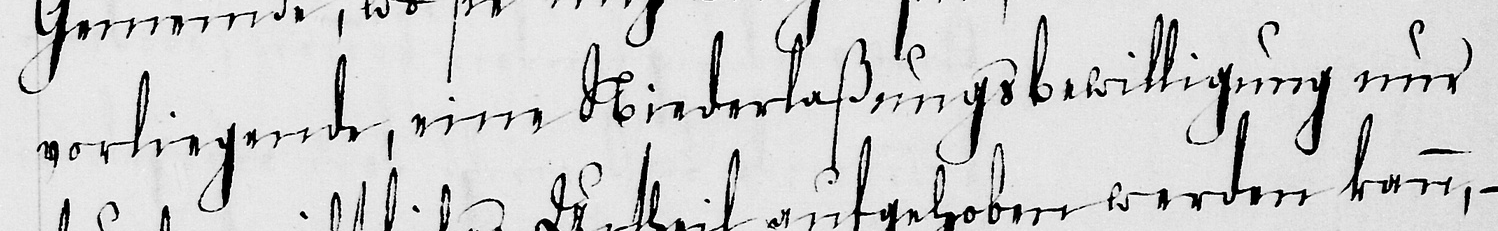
vorliegende, eine Niederlaßungsbewilligung nur
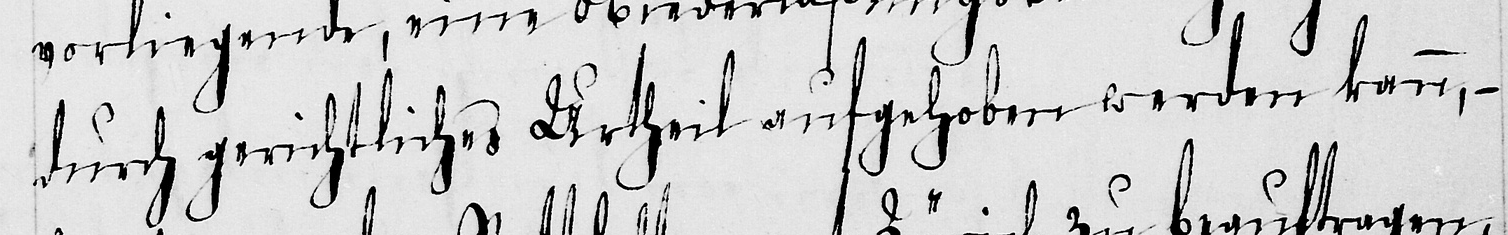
durch gerichtliches Urtheil aufgehoben werden kann,
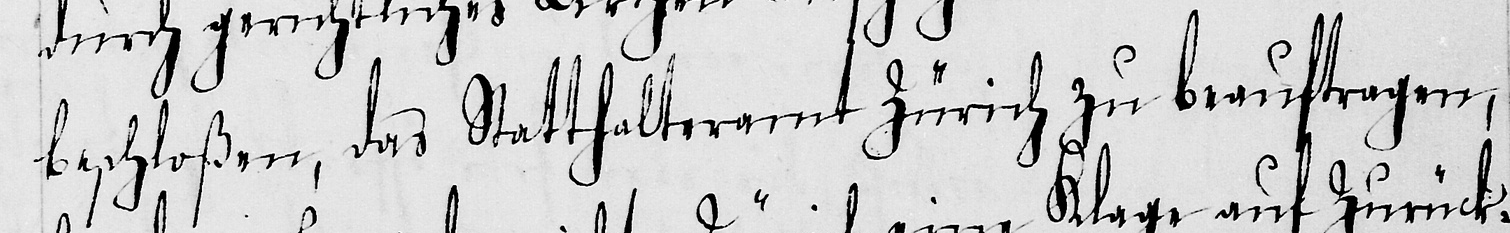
beschloßen, das Statthalteramt Zürich zu beauftragen,
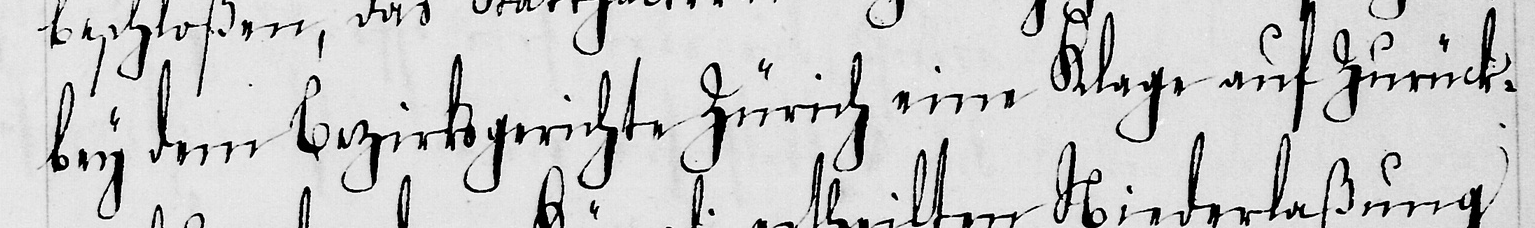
bey dem Bezirksgerichte Zürich eine Klage auf Zurück¬
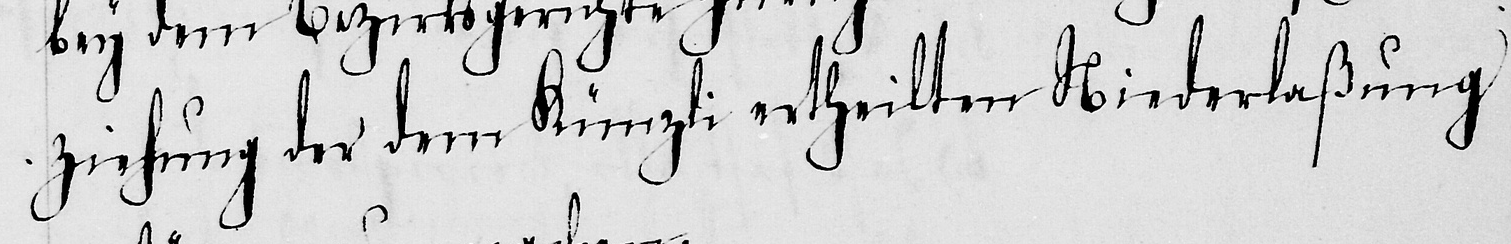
ziehung der dem Künzli ertheilten Niederlaßung
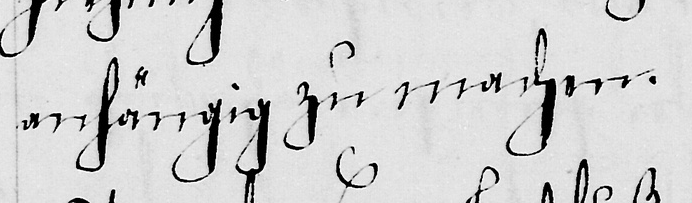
anhängig zu machen.
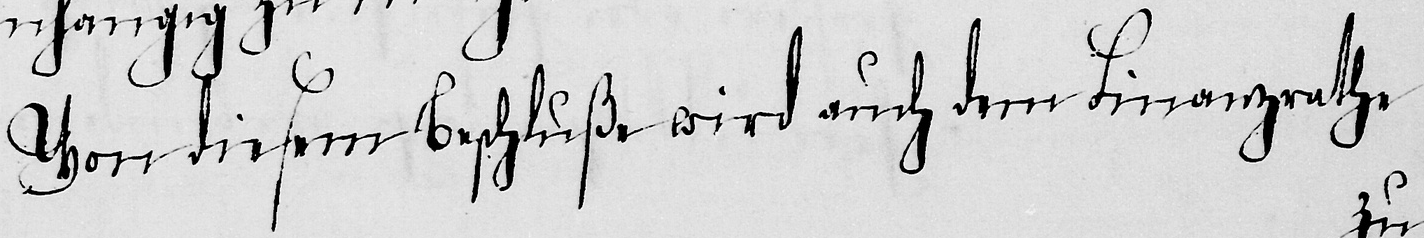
Von diesem Beschluße wird auch dem Finanzrathe
